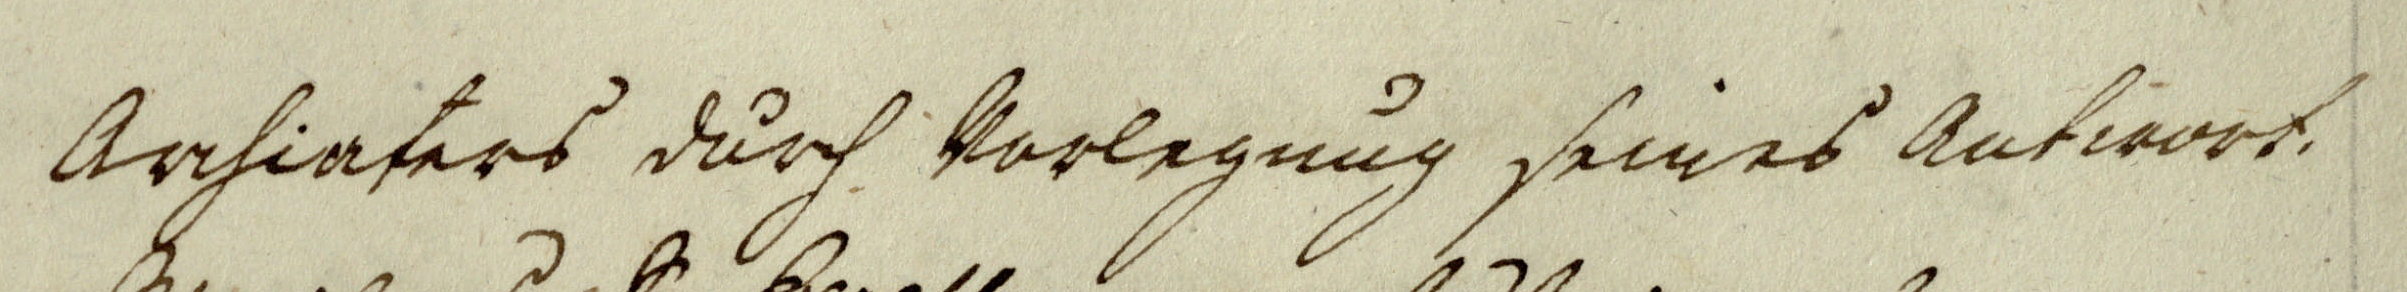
Archiaters durch Vorlegung seines Antwort¬
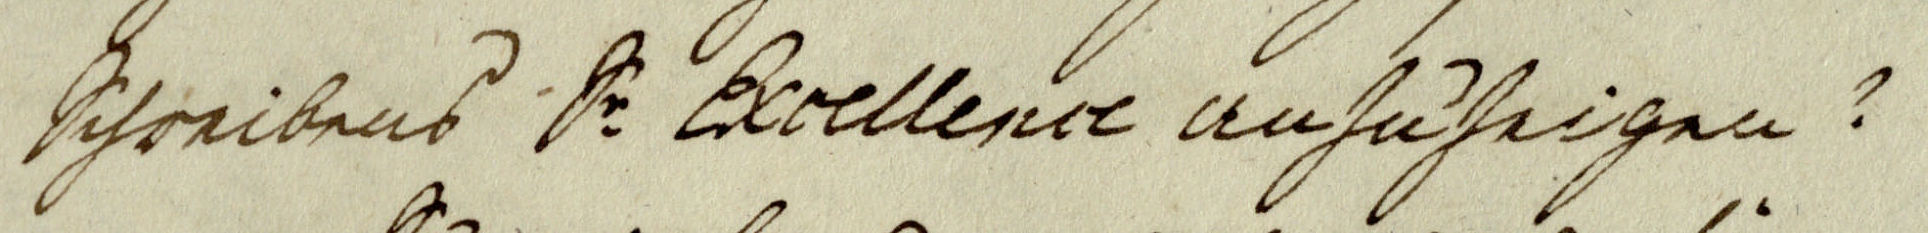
Schreibens Sr Excellence anzuzeigen?
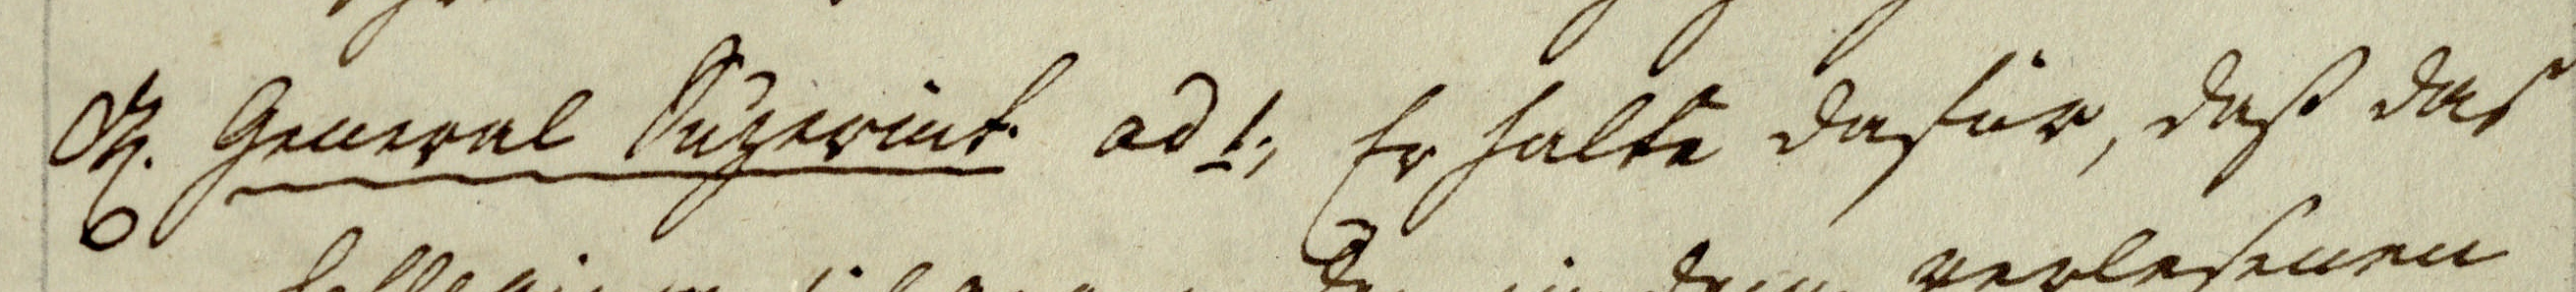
dh. General Superint. ad 1., Er halte dafür, daß das
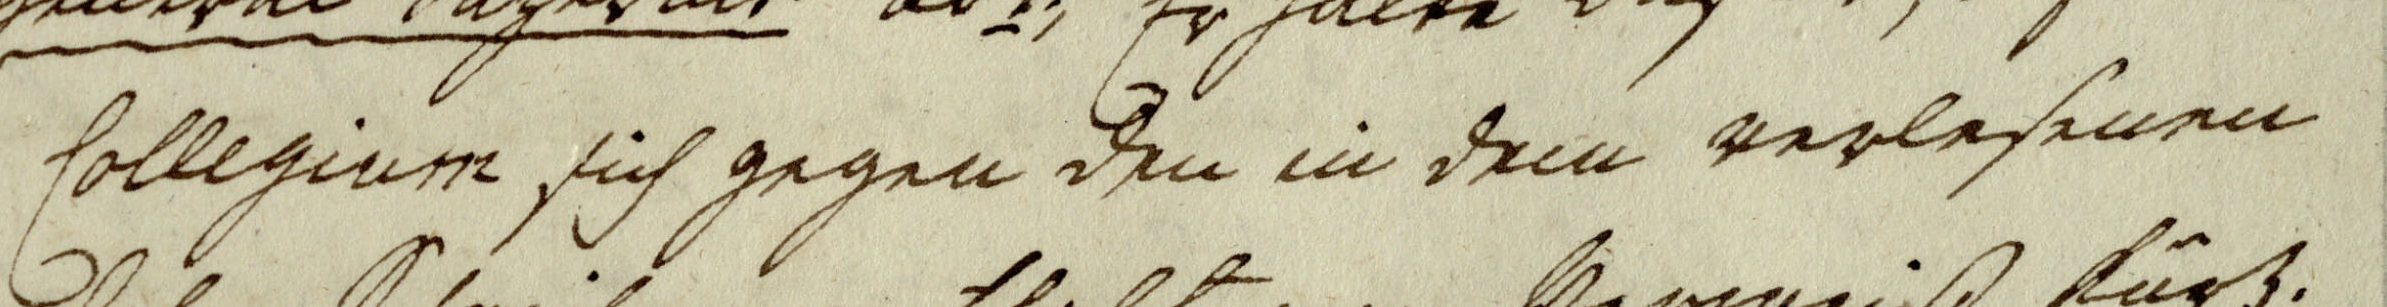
Collegium sich gegen den in dem verlesenen
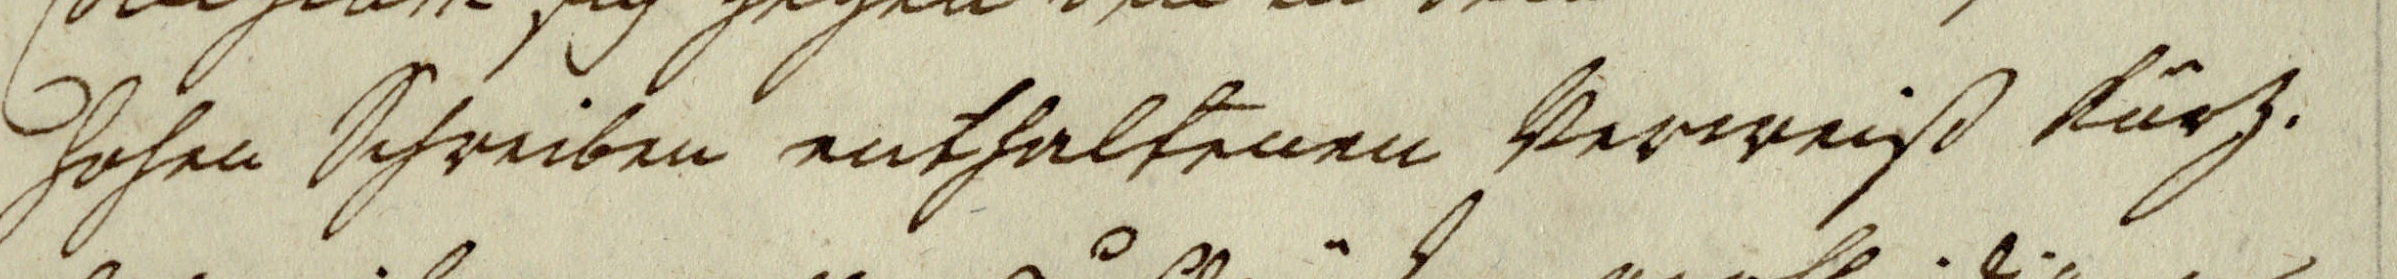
hohen Schreiben enthaltenen Verweis kürz¬
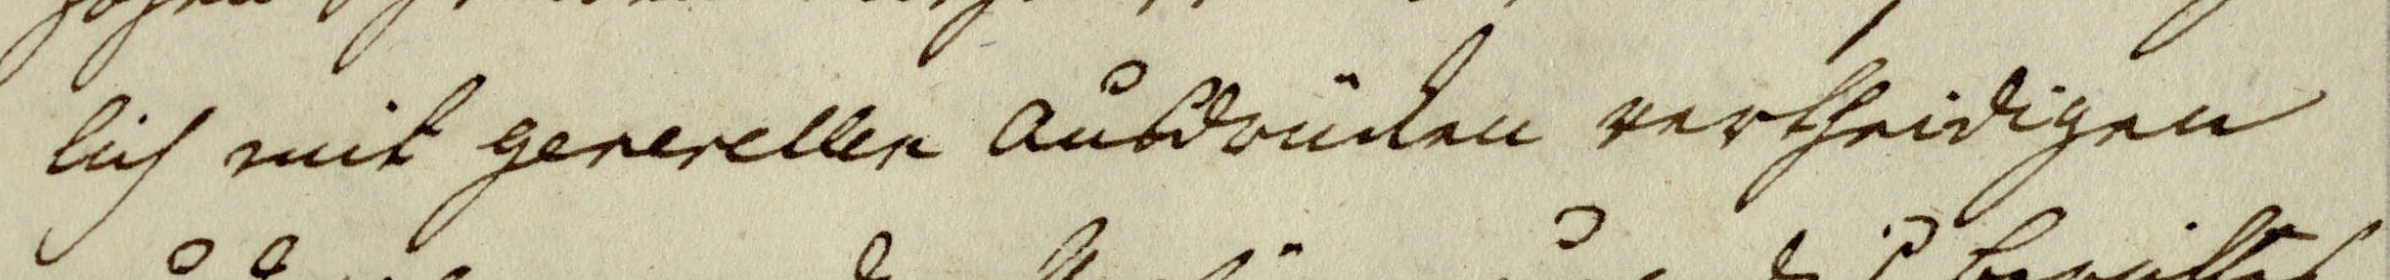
lich mit generellen Ausdrücken vertheidigen
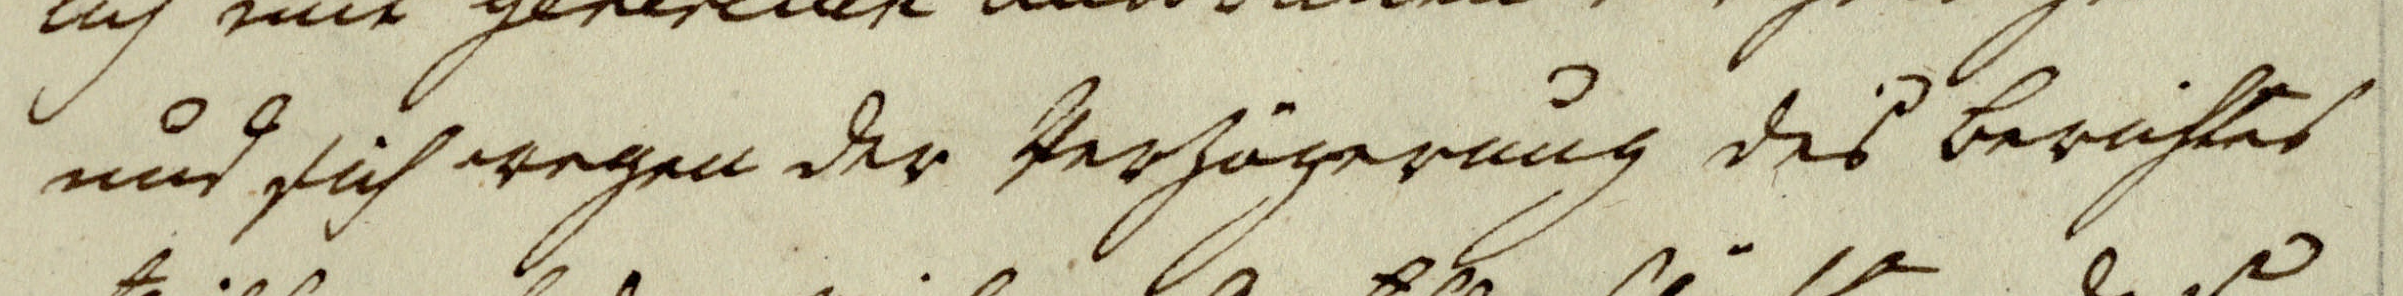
und sich wegen der Verzögerung des Berichtes
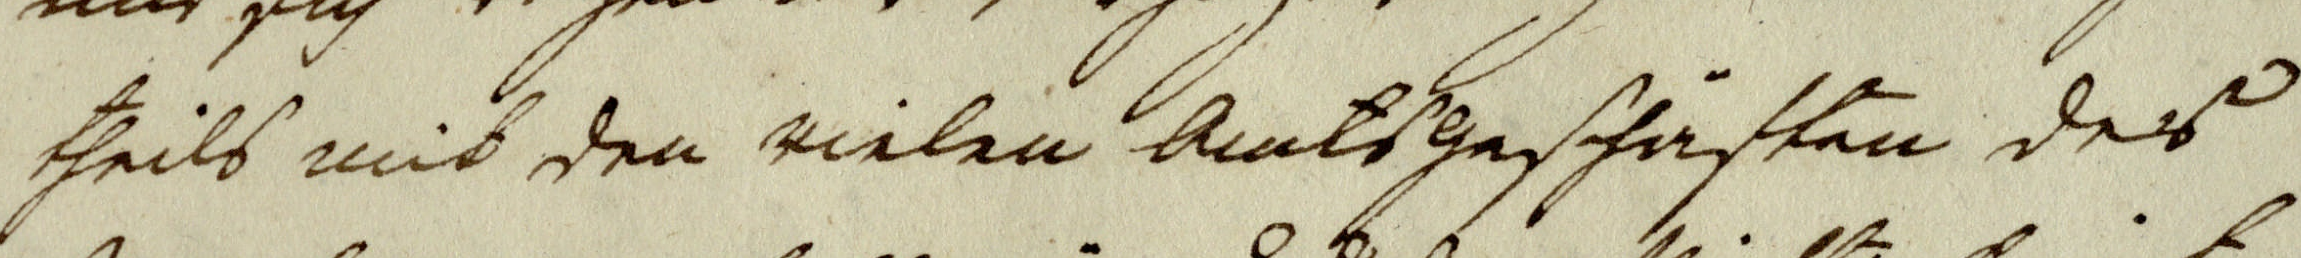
theils mit den vielen Amtsgeschäften der
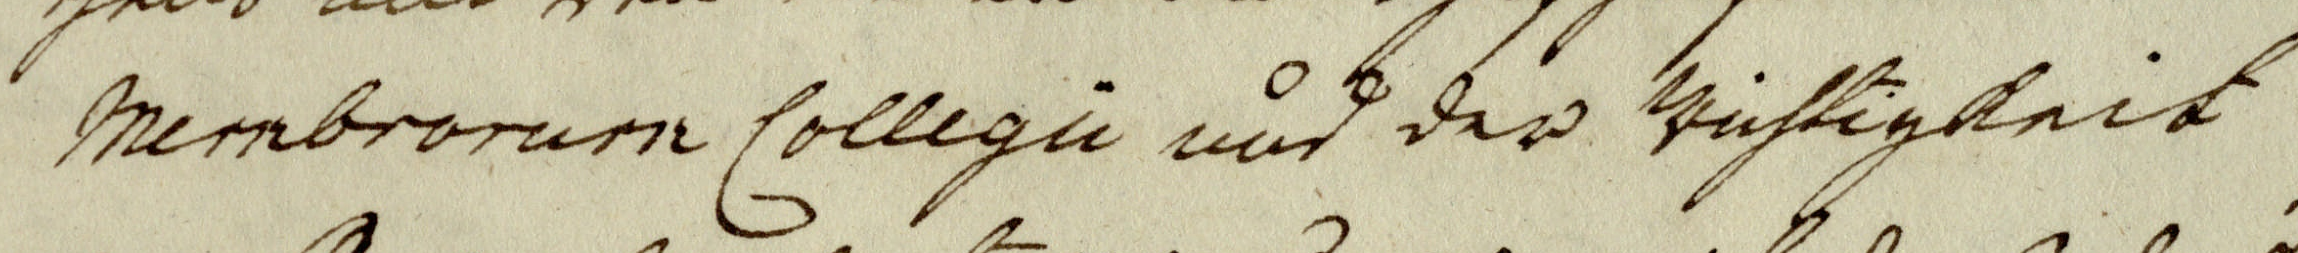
Membrorum Collegii und der Wichtigkeit
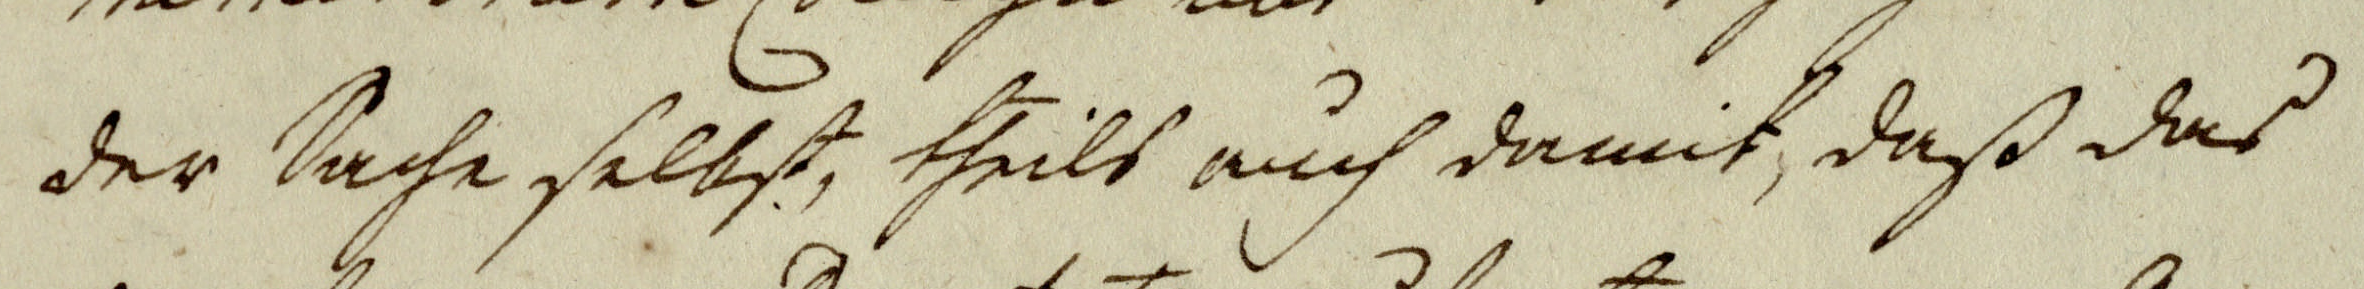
der Sache selbst, theils auch damit, daß das
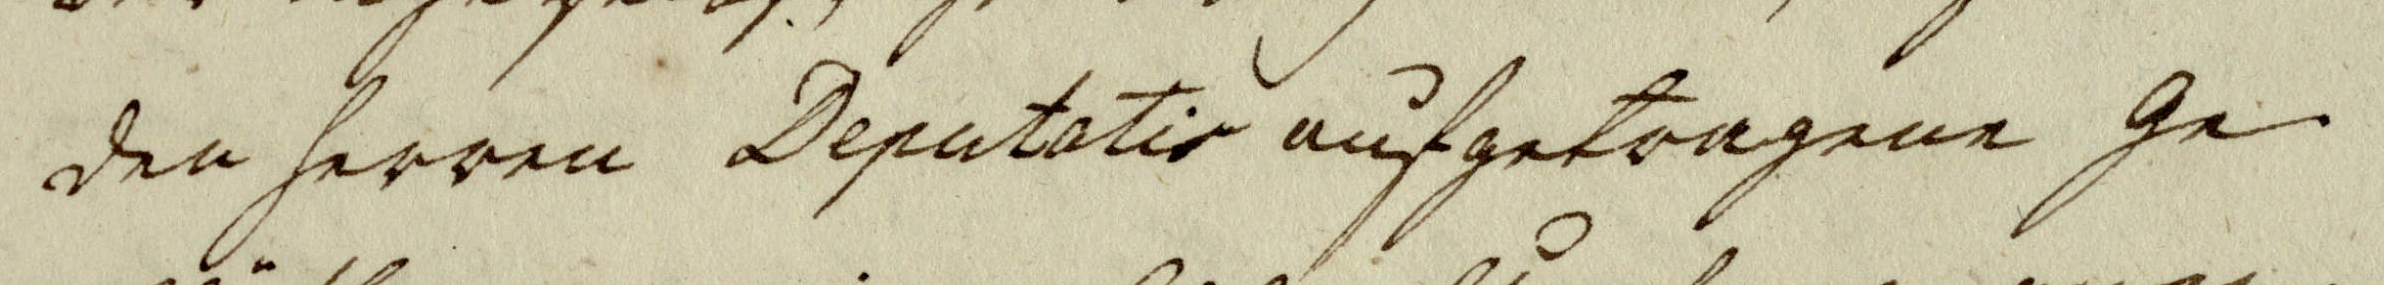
den Herren Deputatis aufgetragene Ge¬
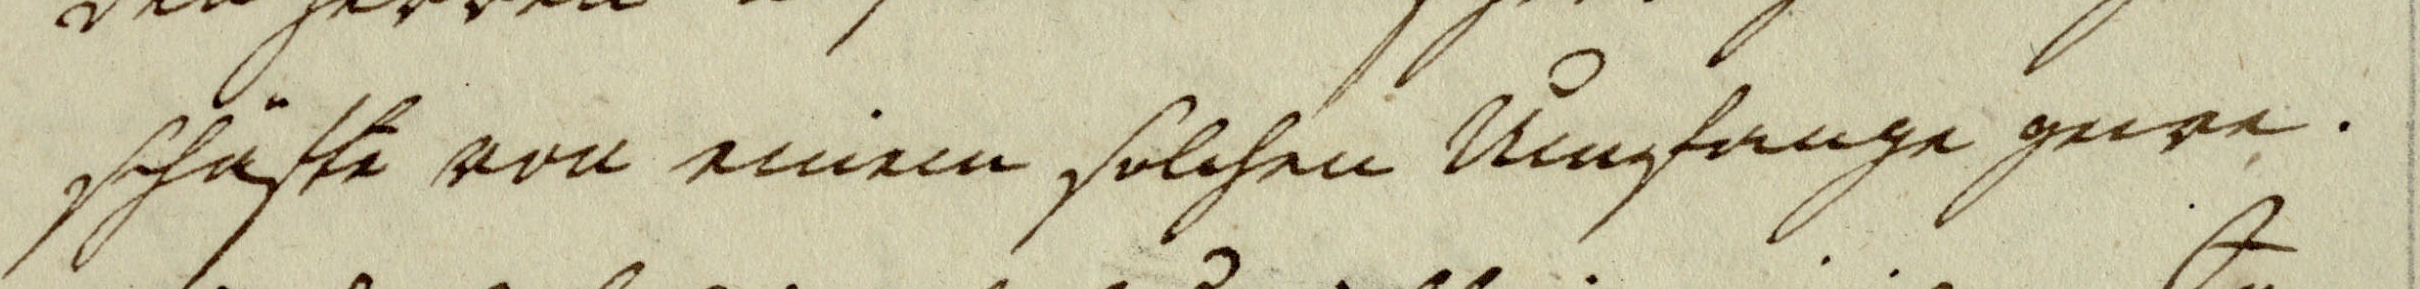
schäfte von einem solchen Umfange gewe¬
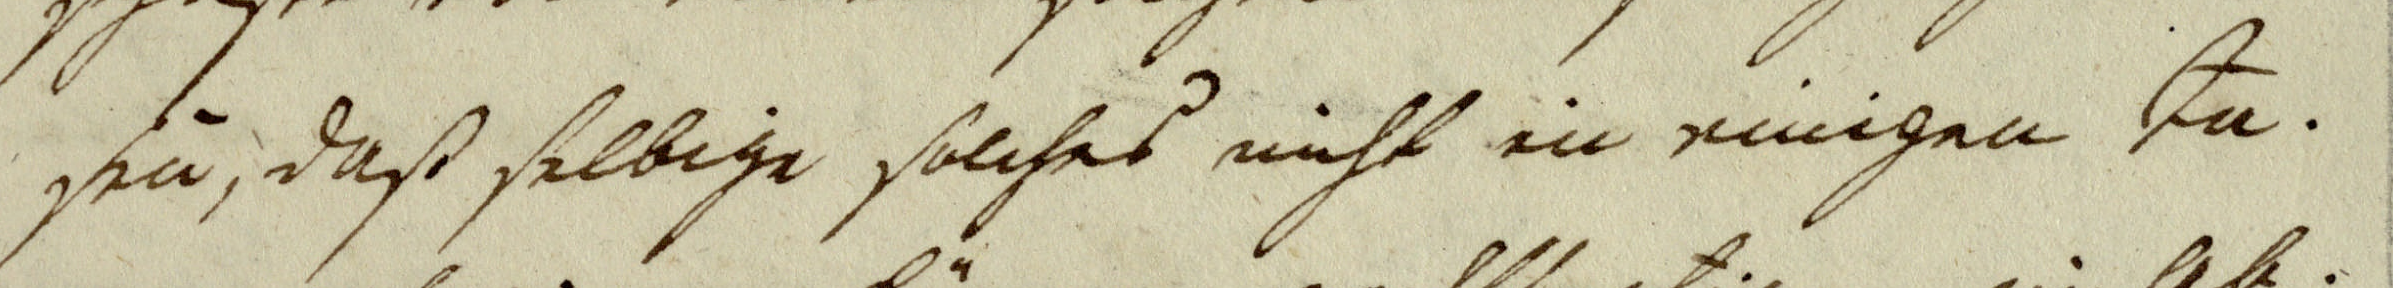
sen, daß selbige solches nicht in einigen Ta¬
